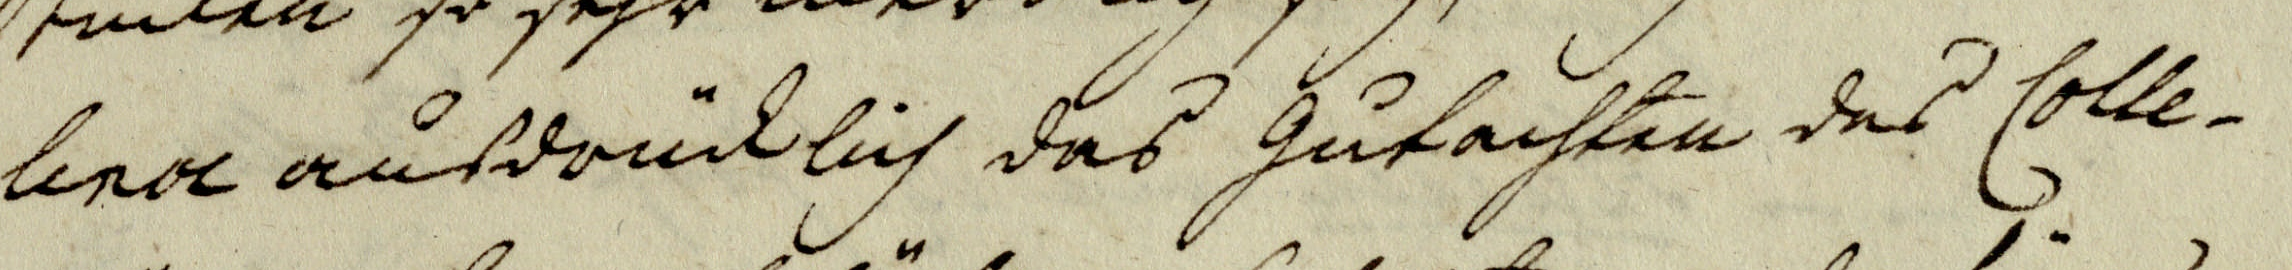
lence ausdrücklich das Gutachten das Colle¬
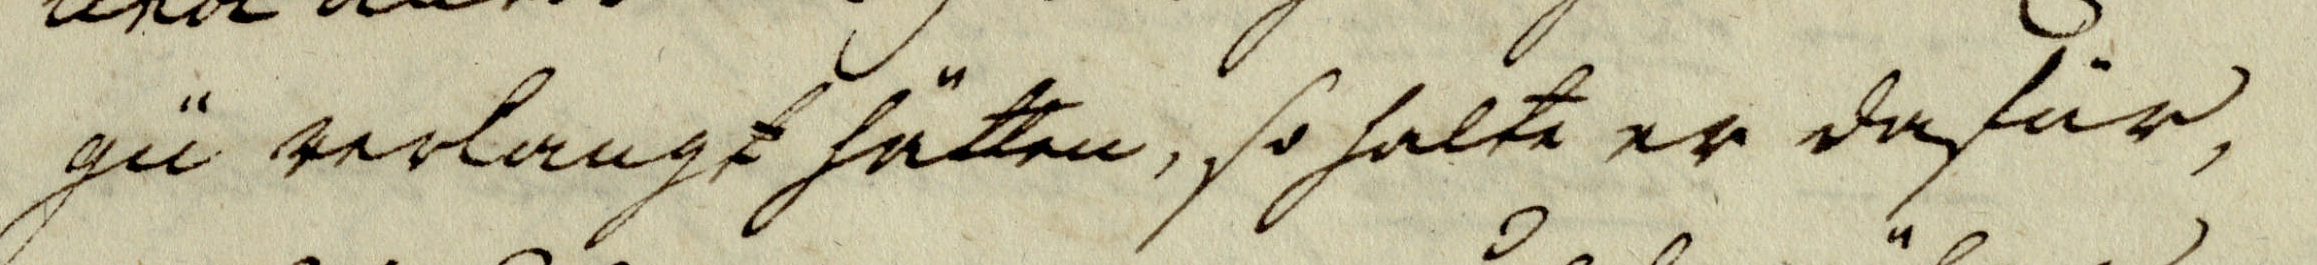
gii verlangt hätten, so halte er dafür,
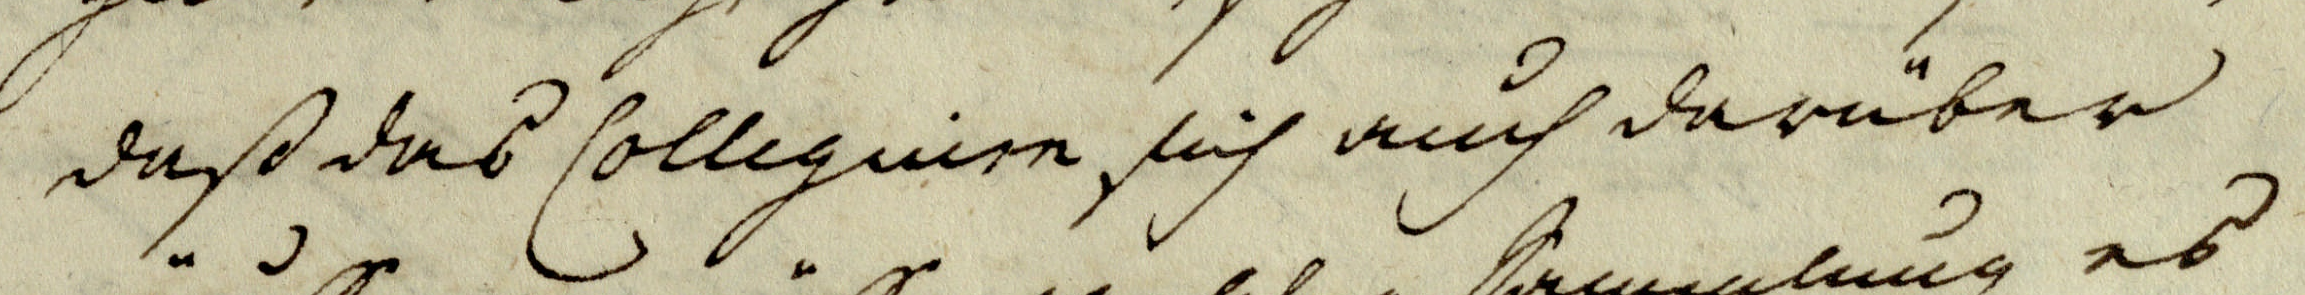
daß das Collegium sich auch darüber
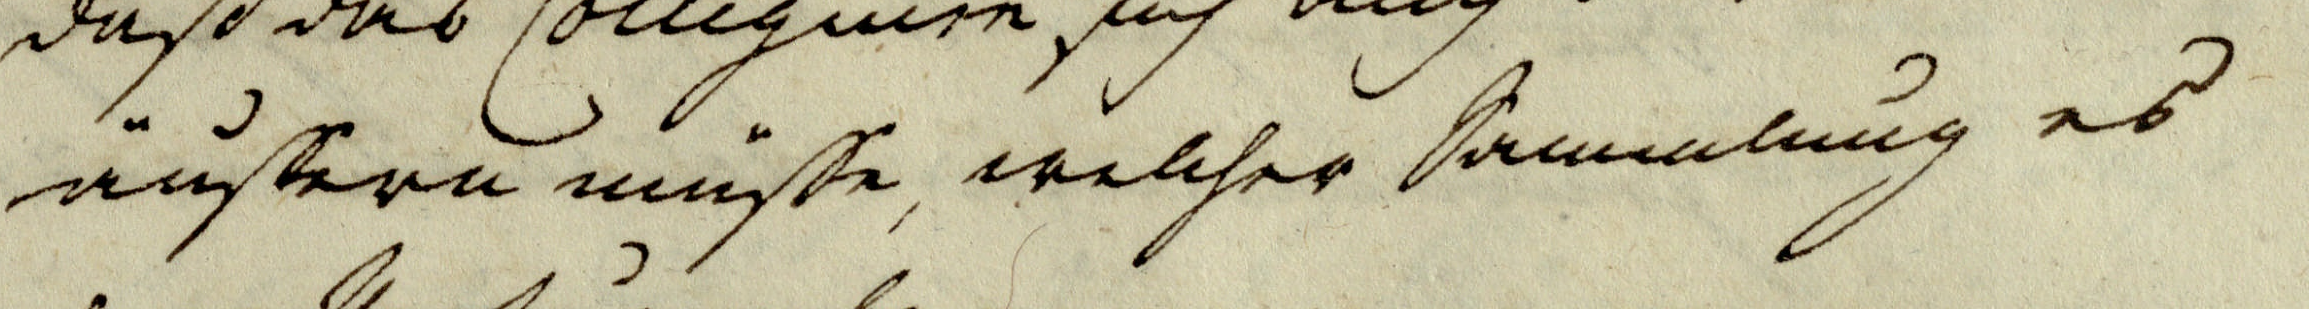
äussern müsste, welcher Sammlung es
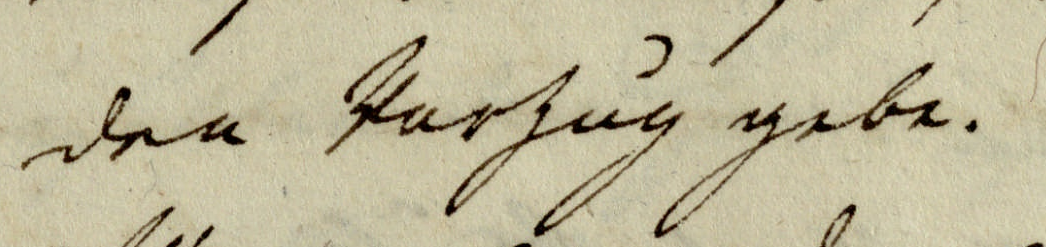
den Vorzug gebe.
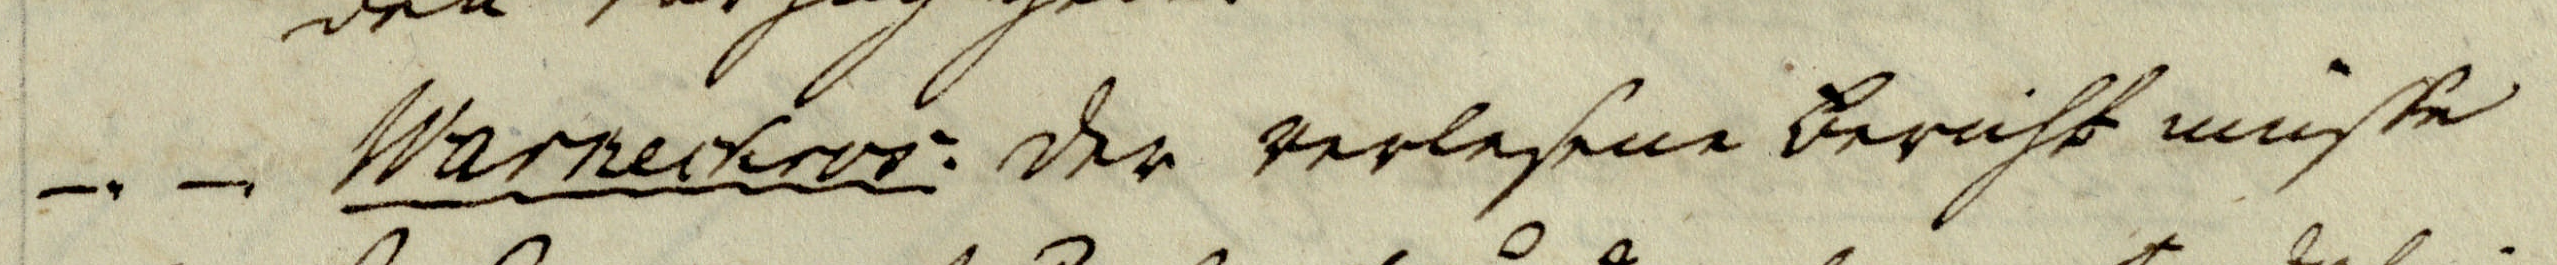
Warneckros. der verlesene Bericht müsse
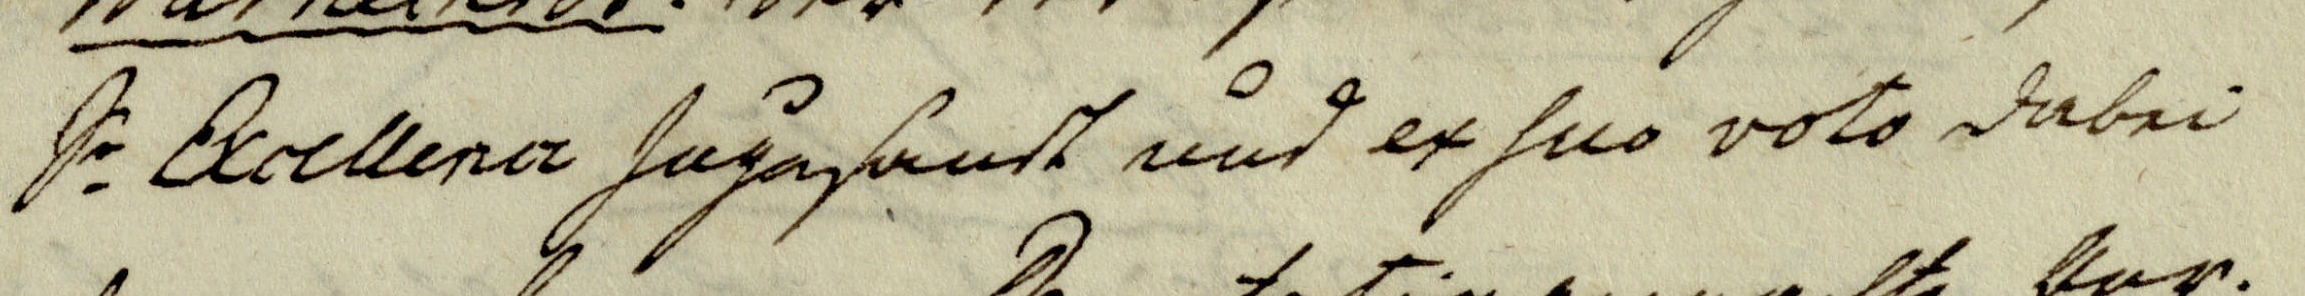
Sr Excellence zugesandt und ex suo voto dabei
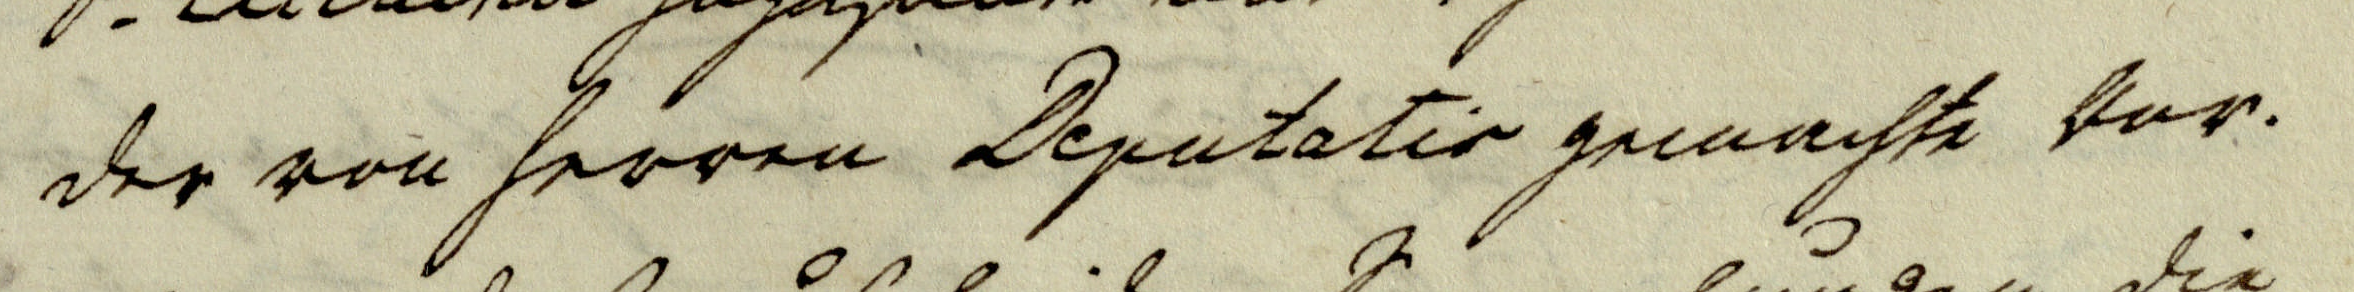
der von Herren Deputatis gemachte Vor¬
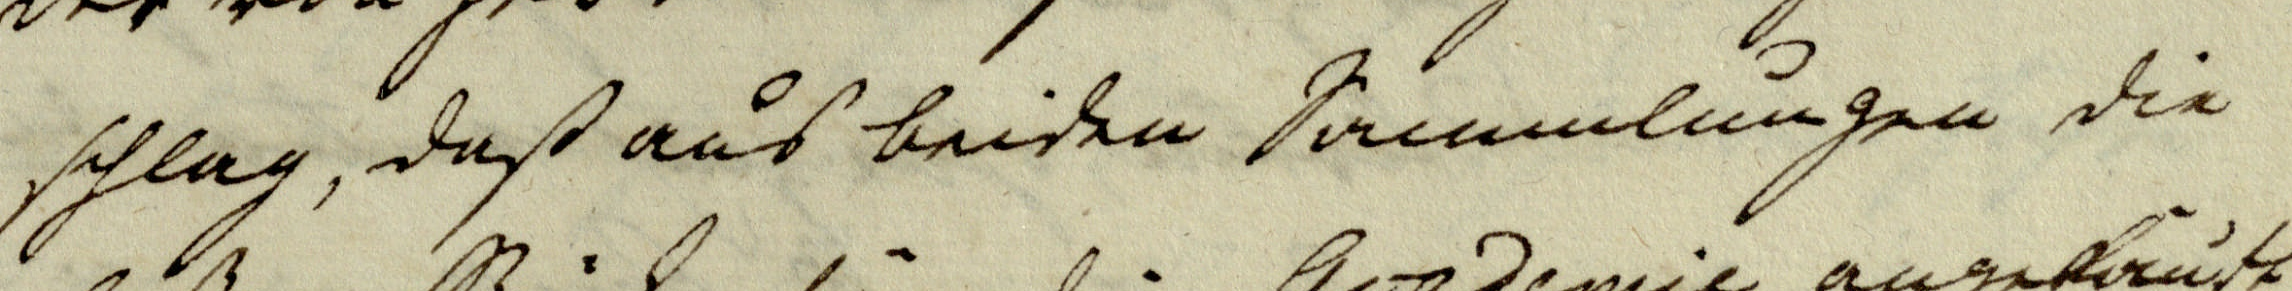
schlag, daß aus beiden Sammlungen die
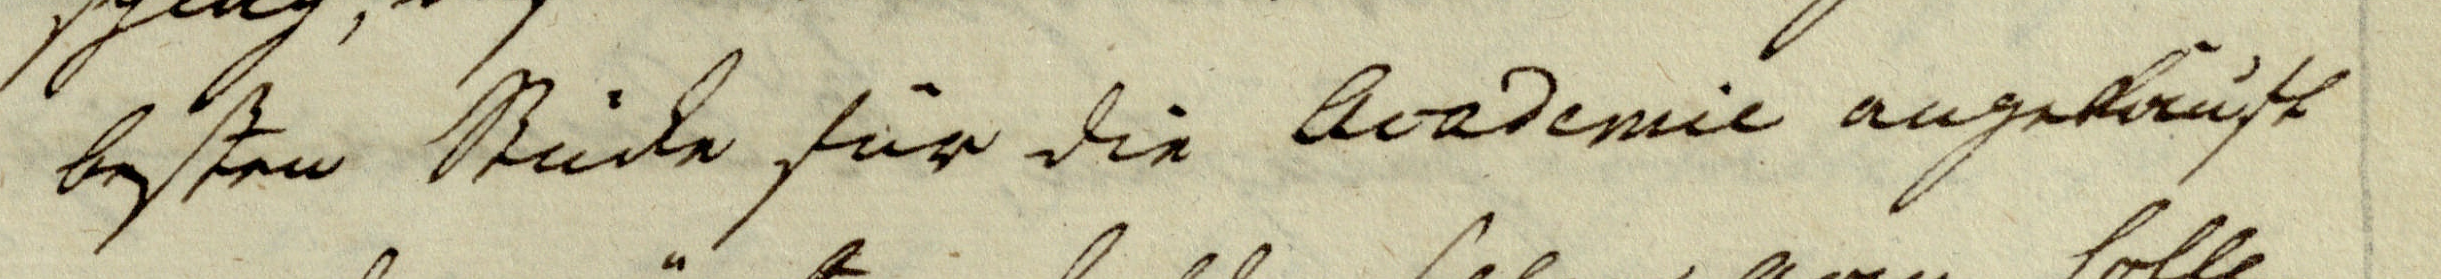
besten Stücke für die Academie angekauft
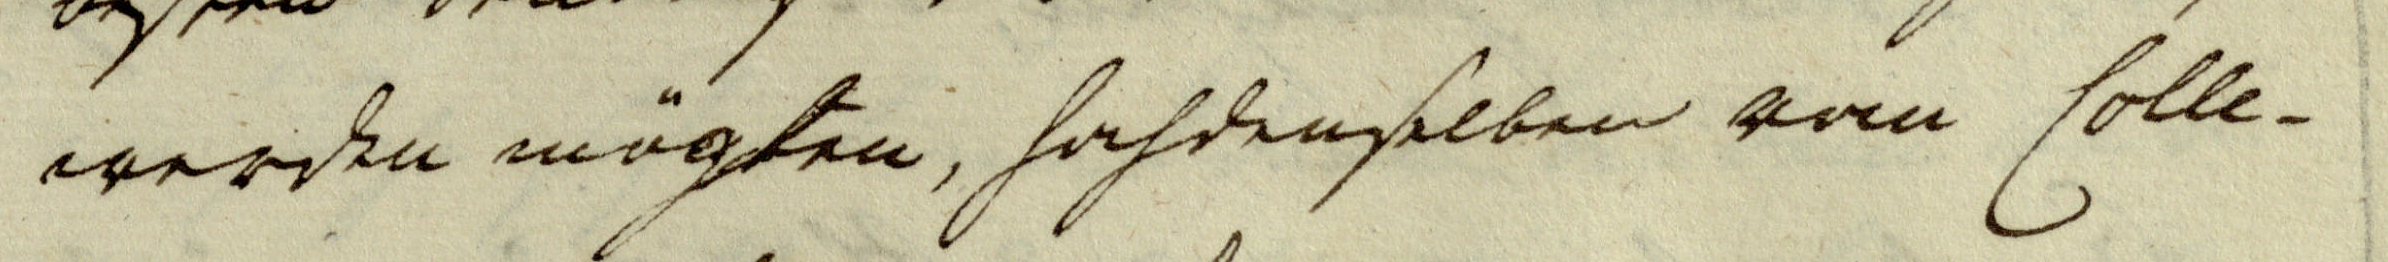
werden mögten, hoachdenselben vom Colle¬
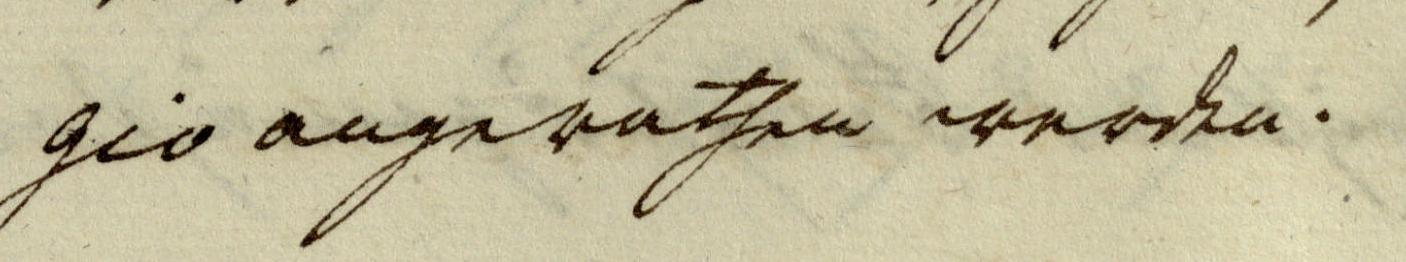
gio angerathen werden.
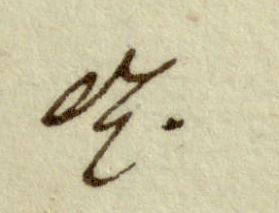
dh.
